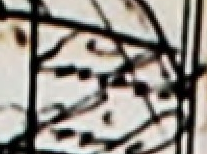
??
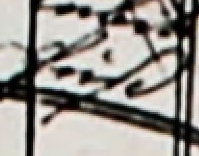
?
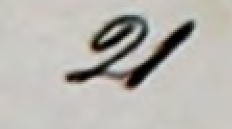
21
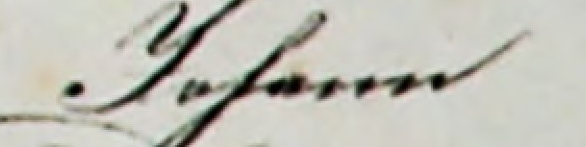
Johann
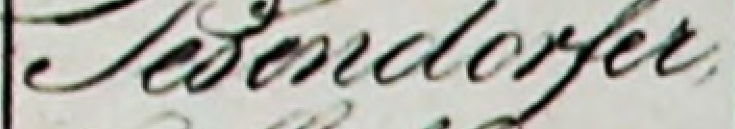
Pesendorfer,
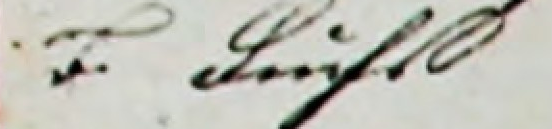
v. Fuchs
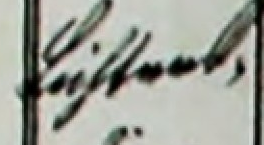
Lichterl„
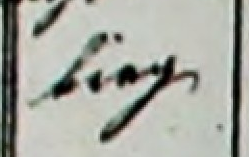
berg
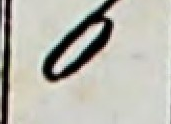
6
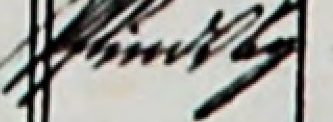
Pflindsbg
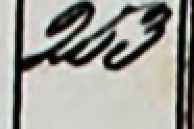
263
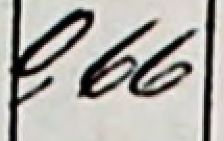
0,66
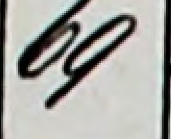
69
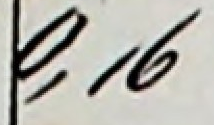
0,16
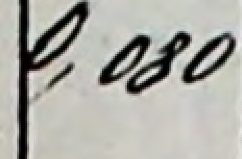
0,080
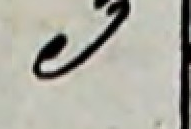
3
